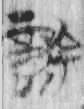○（舒）
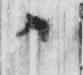人
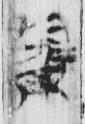○（歸）
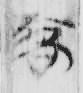客
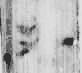之
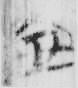金
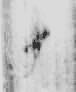十
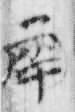兩
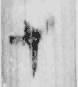又
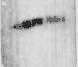一
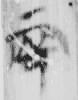兩
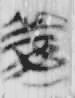義
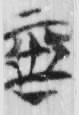亞
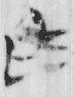爲
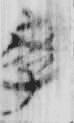李
